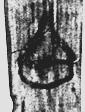白（伯）
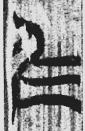○（夷）
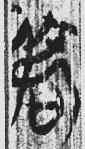○（叔）
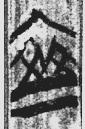齊
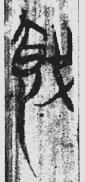○（餓）
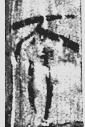而
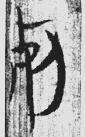死
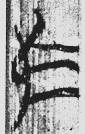於
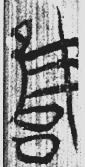○（雝）
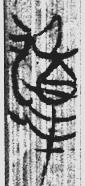○（瀆）
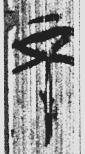不
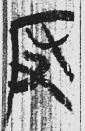辱
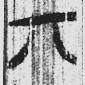亓（其）
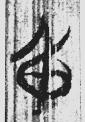身
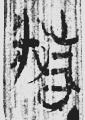精
